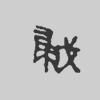侵
